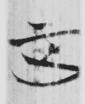正
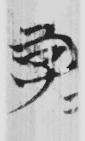乳=
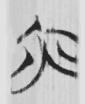亦
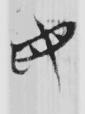母
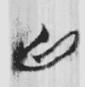㠯（以）
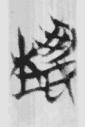埶
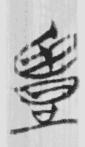{臣豆}
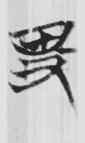卑
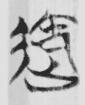御
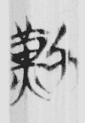勤
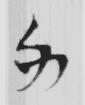力
